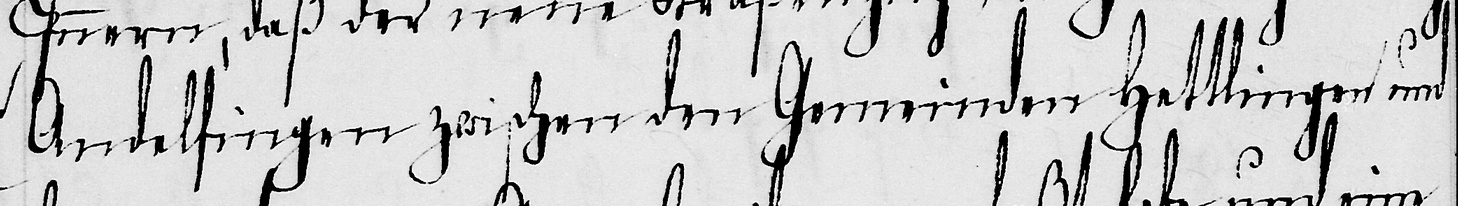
Andelfingen zwischen den Gemeinden Hettlingen und
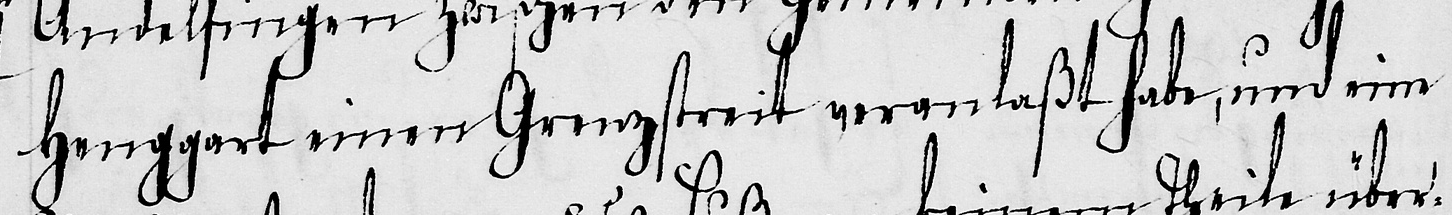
Henggart einen Grenzstreit veranlaßt habe, und eine
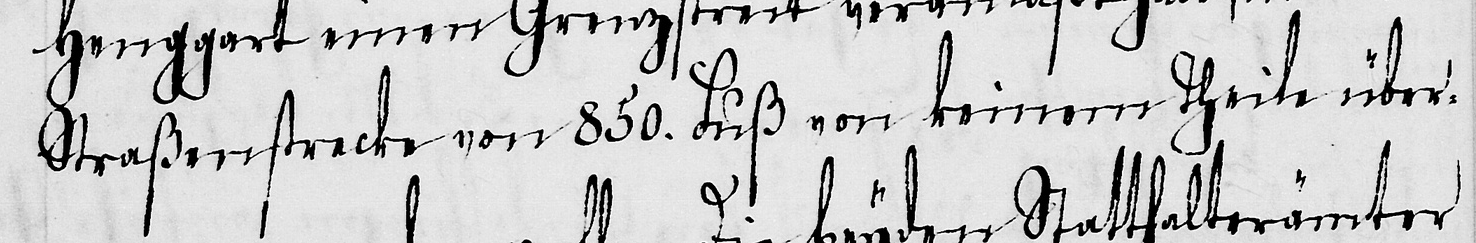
Straßenstrecke von 850. Fuß von keinem Theile über¬
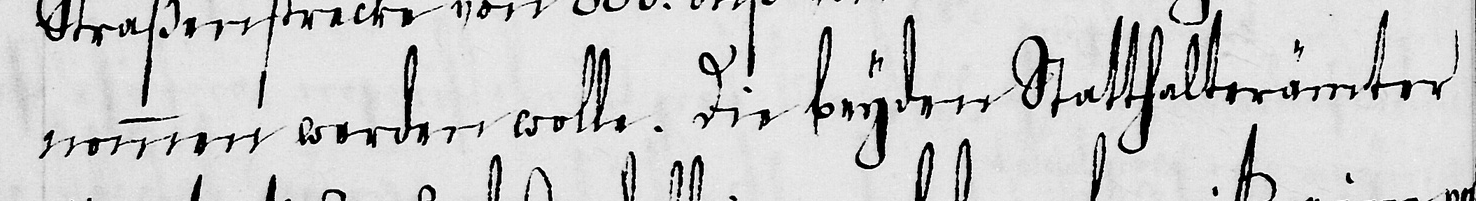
nommen werden wolle. Die beyden Statthalterämter
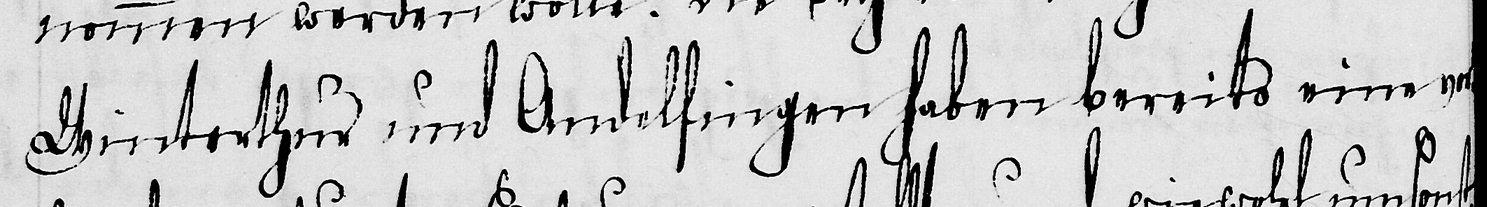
Winterthur und Andelfingen haben bereits eine
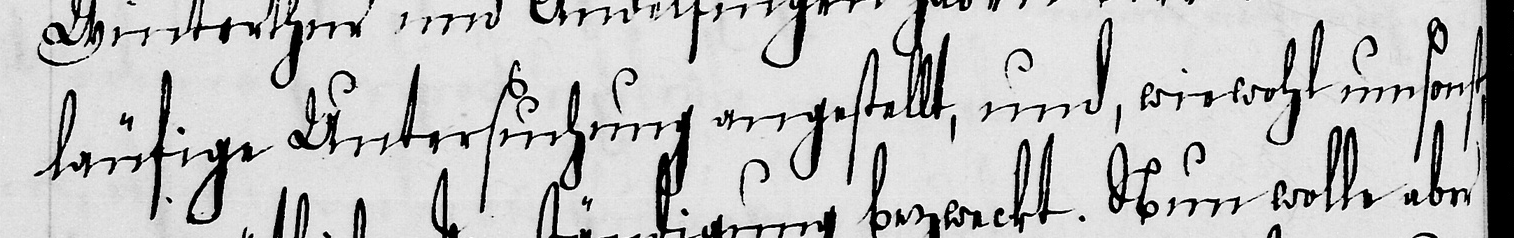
läufige Untersuchung angestellt, und, wiewohl umson¬
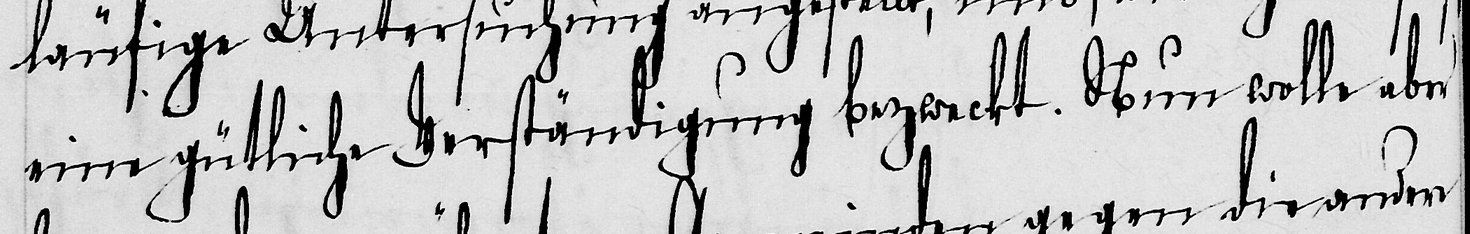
eine gütliche Verständigung bezweckt. Nun wolle
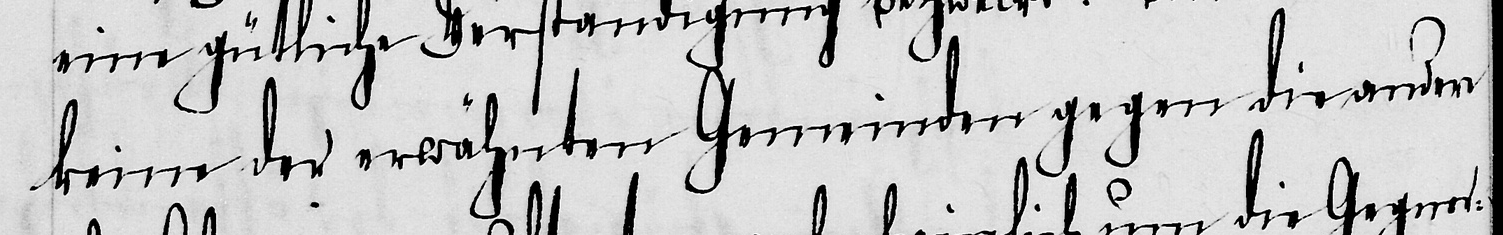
keine der erwähnten Gemeinden gegen die andere
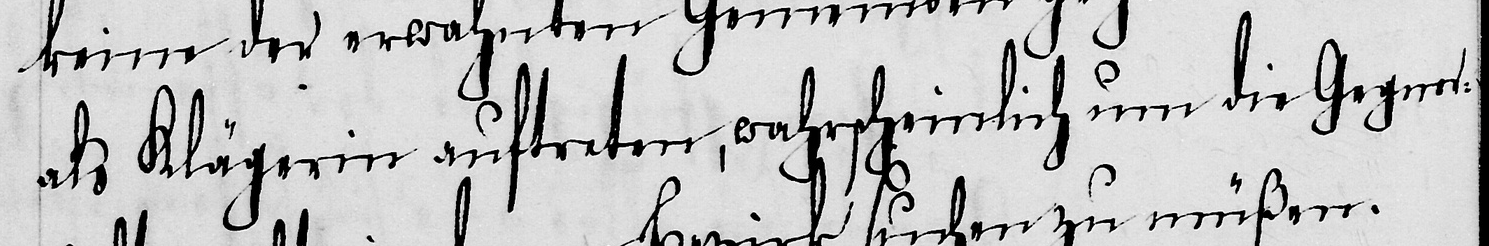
als Klägerin auftreten, wahrscheinlich um die Gegne¬
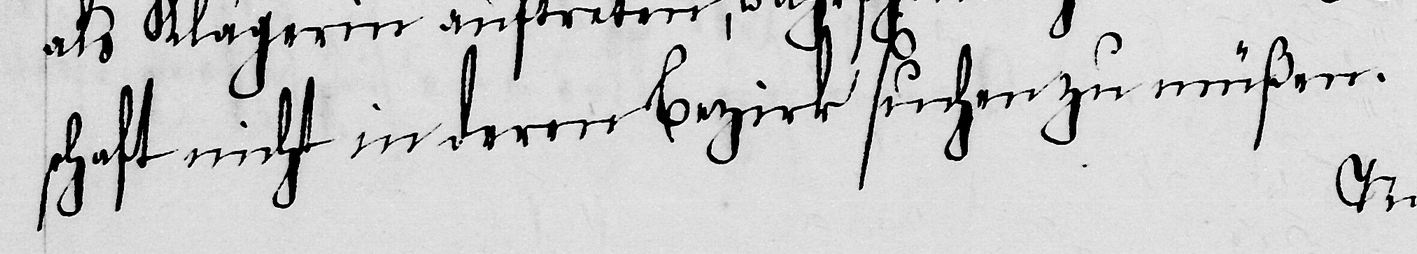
rschaft nicht in deren Bezirk suchen zu müßen.
